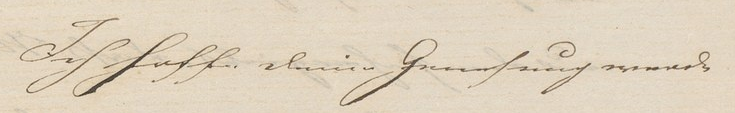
Ich hoffe Deine Genesung werde
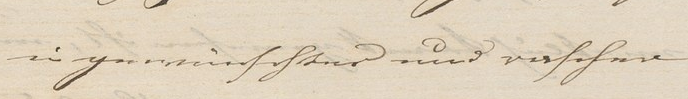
in gewünschter und rascher
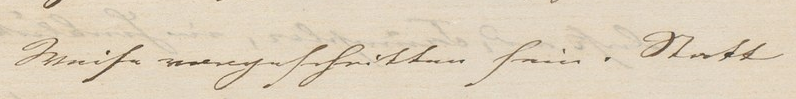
Weise vorgeschritten sein. Statt
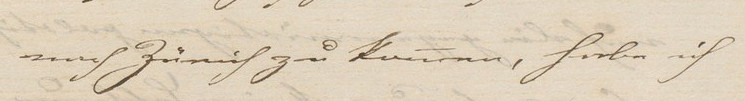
nach Zürich zu kommen, habe ich
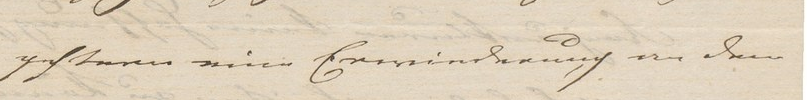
gestern eine Erwiederung an den
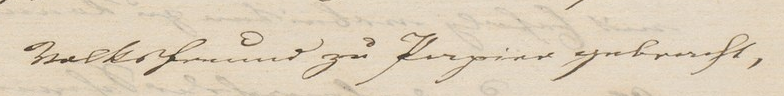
Volksfreund zu Papier gebracht,
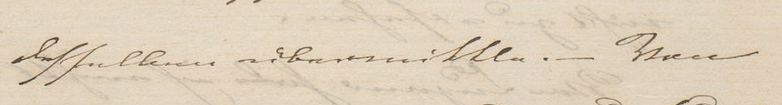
desselben übermittle. – Von
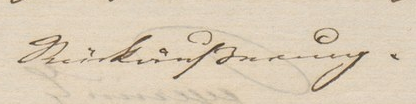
Rückäußerung.
